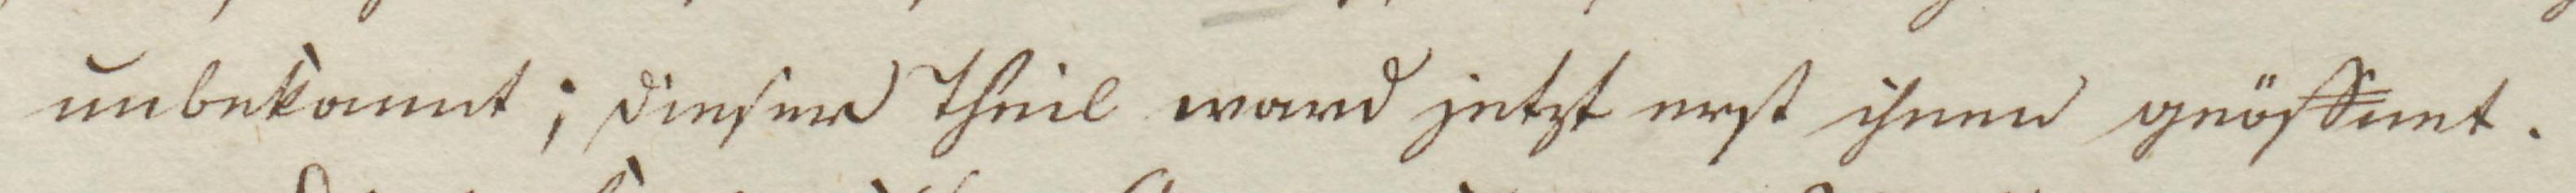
unbekannt; dieser Theil ward jetzt erst ihnen geöffnet.
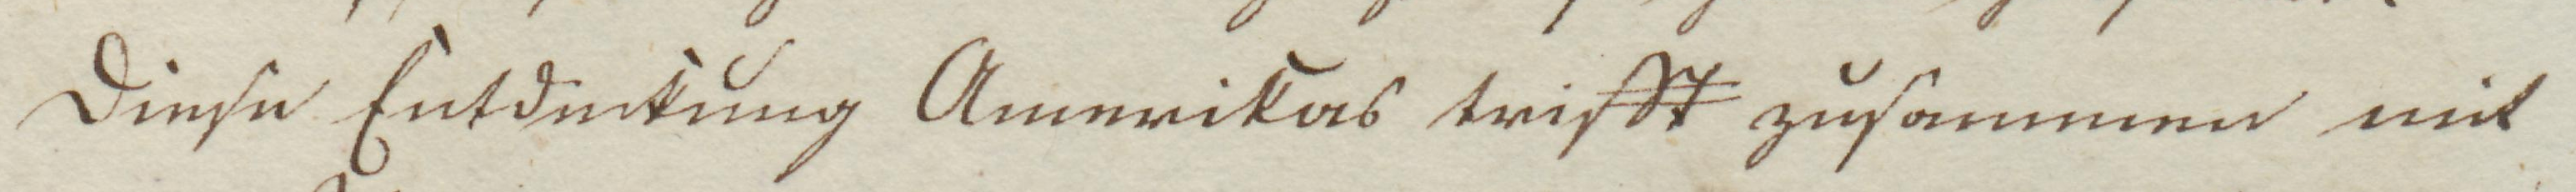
Diese Entdeckung Amerikas trifft zusammen mit
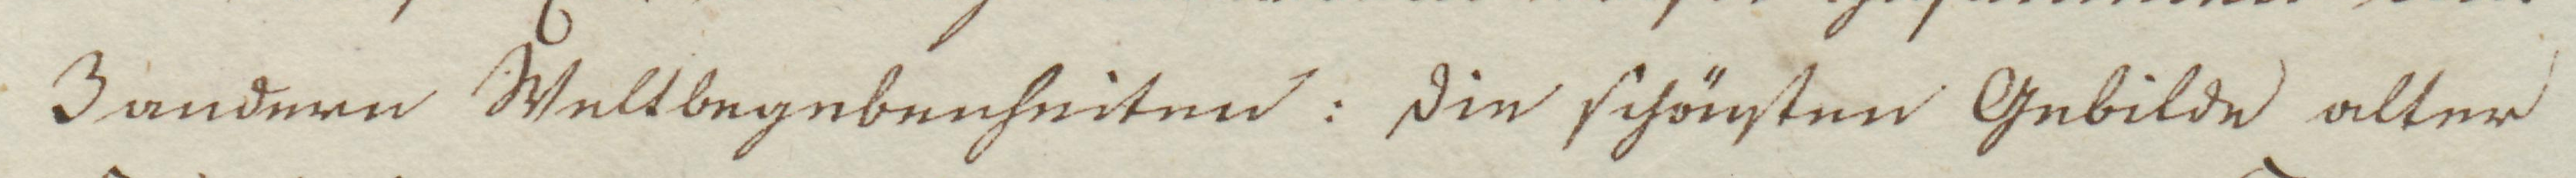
3 andern Weltbegebenheiten: die schönsten Gebilde alter
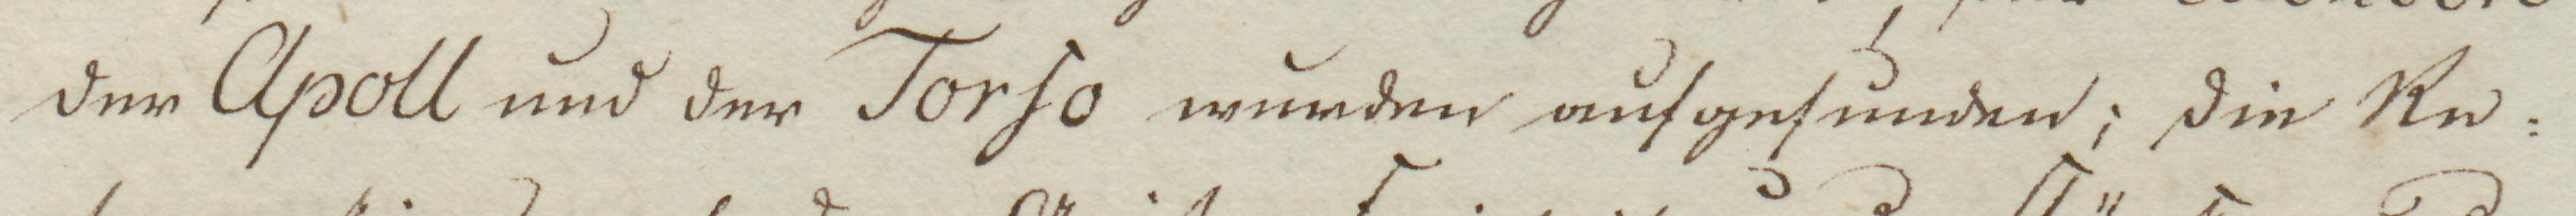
der Apoll und der Torso wurden aufgefunden; die Re-
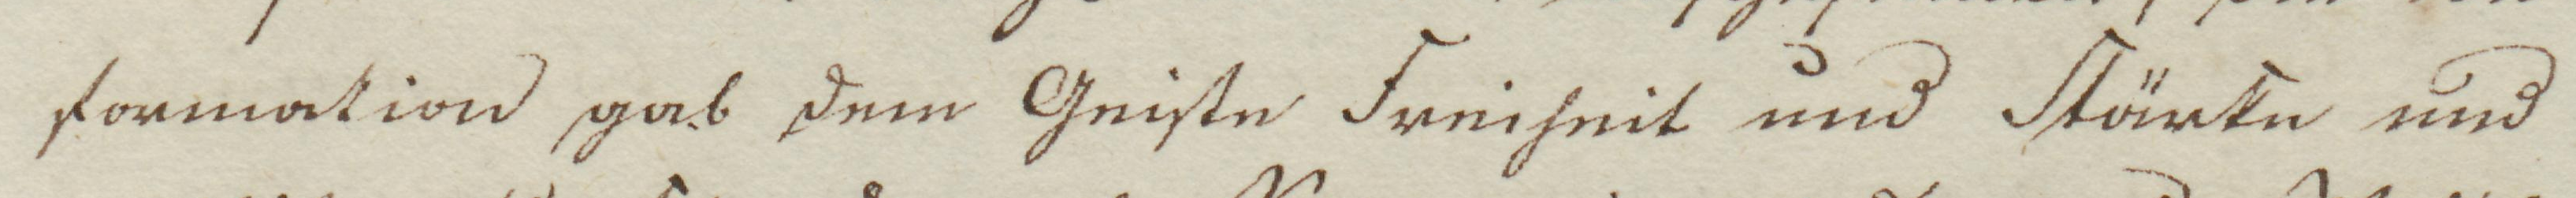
formation gab dem Geiste Freiheit und Stärke und
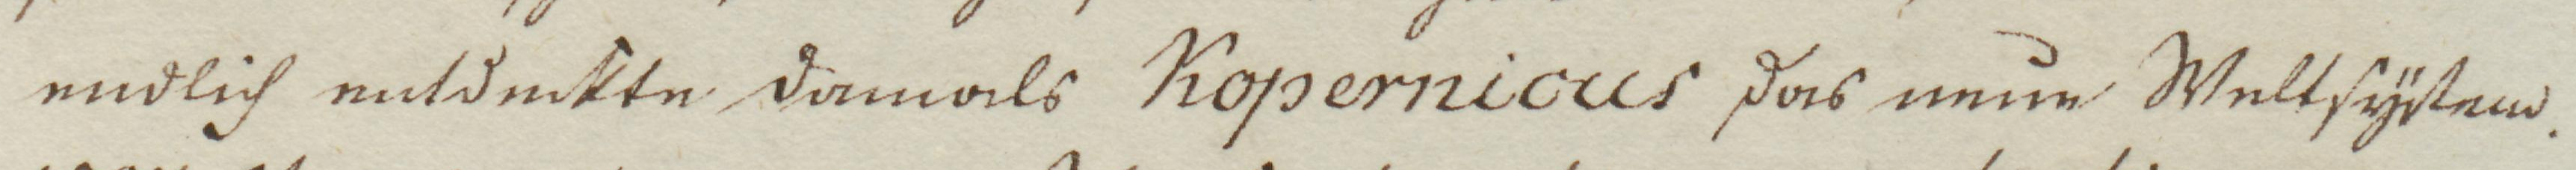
endlich entdeckte damals Kopernicus das neue Weltsÿstem.
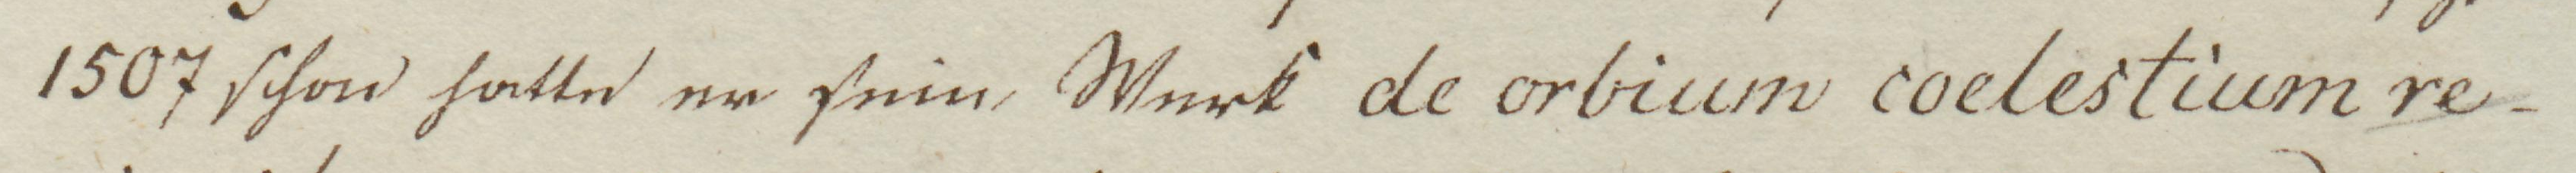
1507 schon hatte er sein Werk de orbium coelestium re-
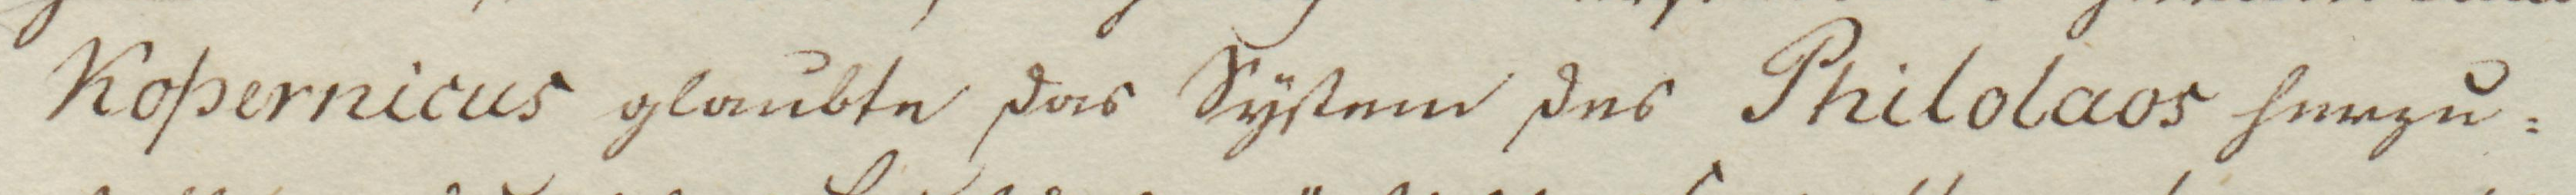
Kopernicus glaubte das Sÿstem des Philolaos herzu-
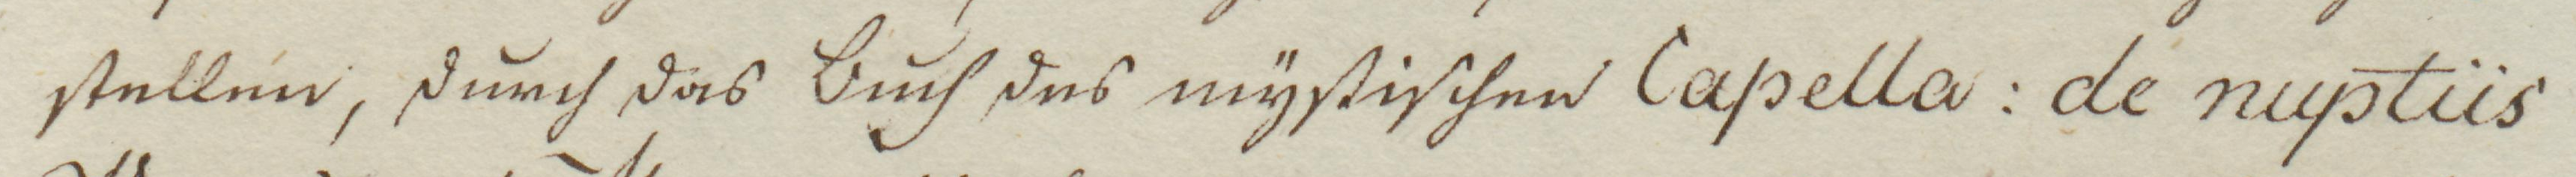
stellen, durch das Buch des mÿstischen Capella: de nuptiis
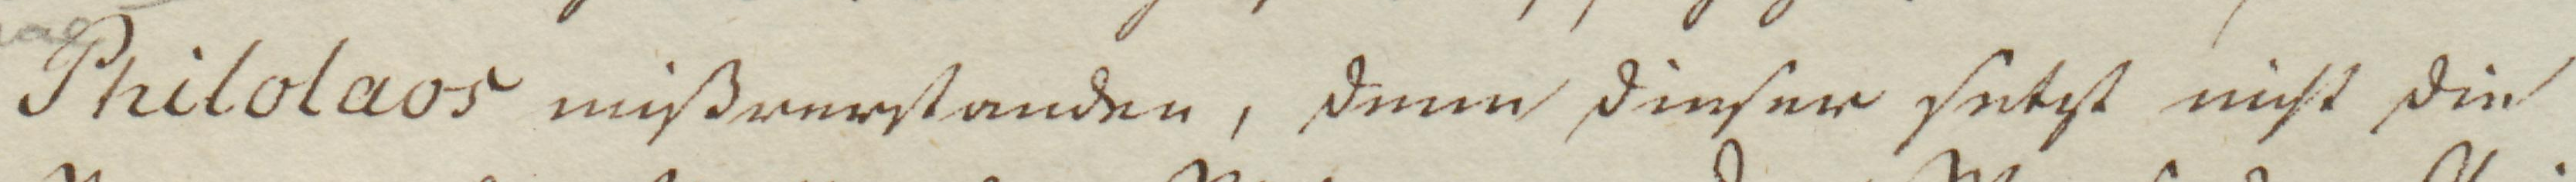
Philolaos mißverstanden, denn dieser setzt nicht die
